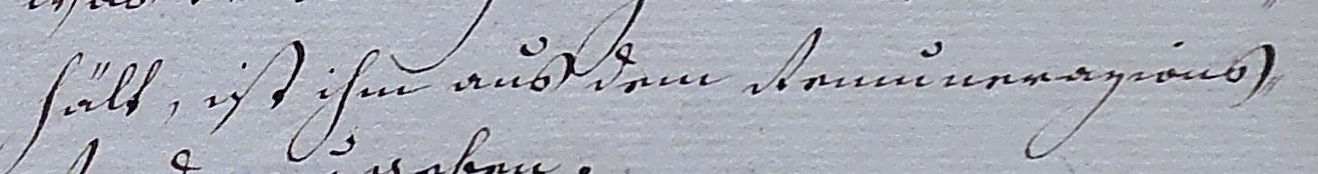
hält, ist ihm aus dem Remunerazions¬
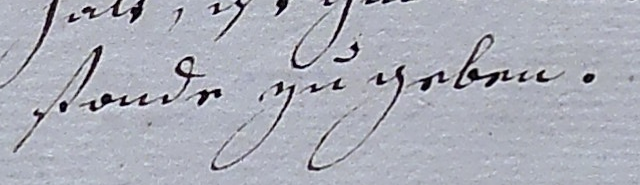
fonde zu geben.
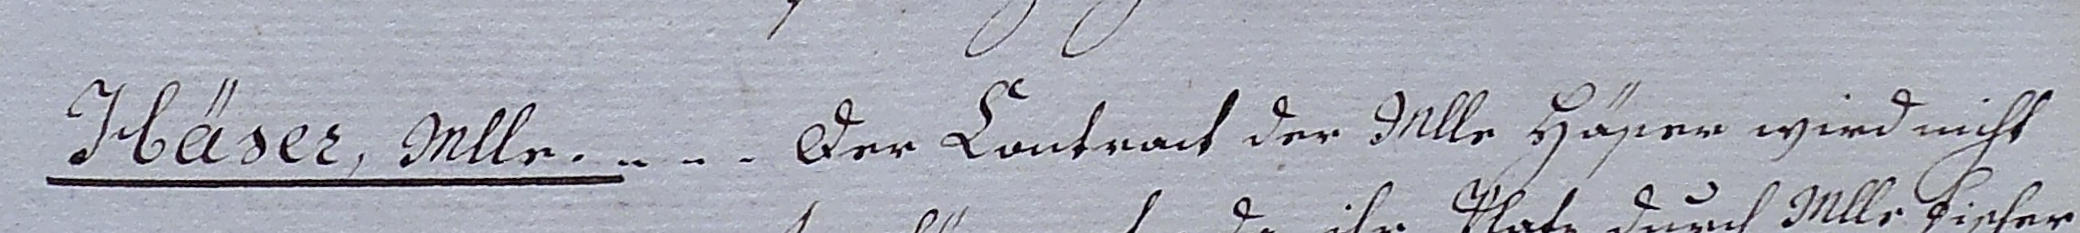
Häser, Mlle. .. .. .. Der Contract der Mlle Häser wird nicht
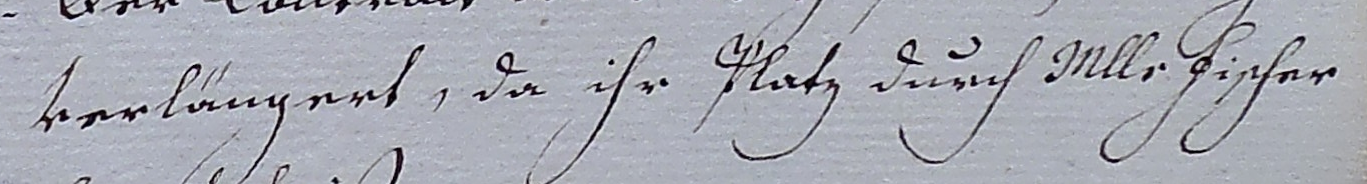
verlängert, da ihr Platz durch Mlle Fischer
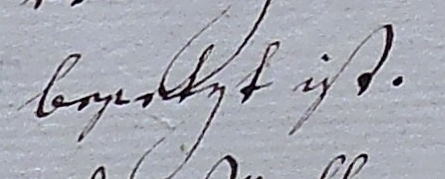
besetzt ist.
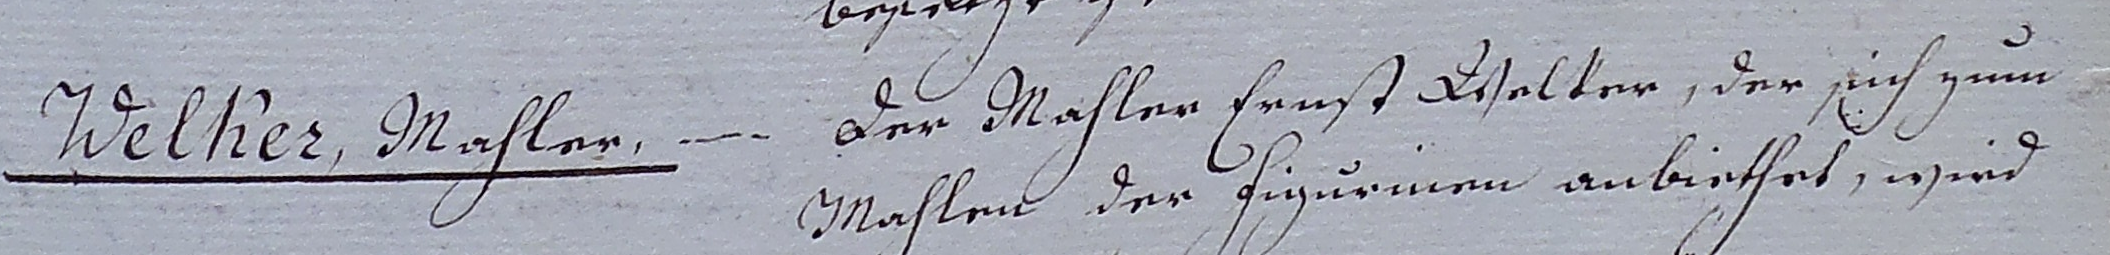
Welker, Mahler. .... Der Mahler Ernst Welker, der sich zum
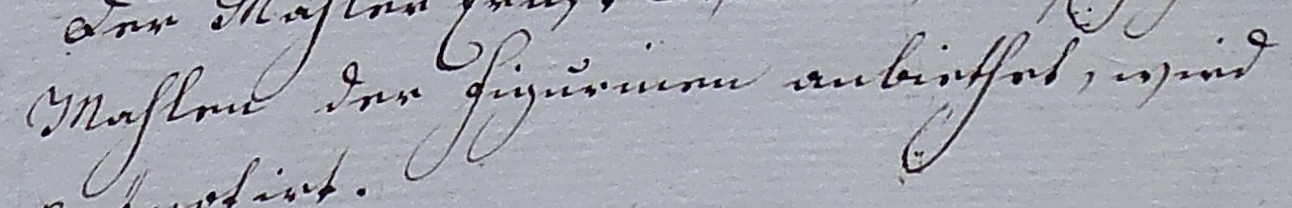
Mahlen der Figurinen anbiethet, wird
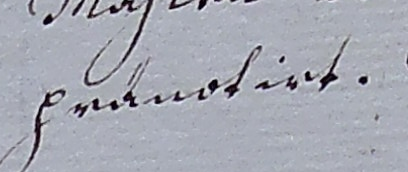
pränotirt.
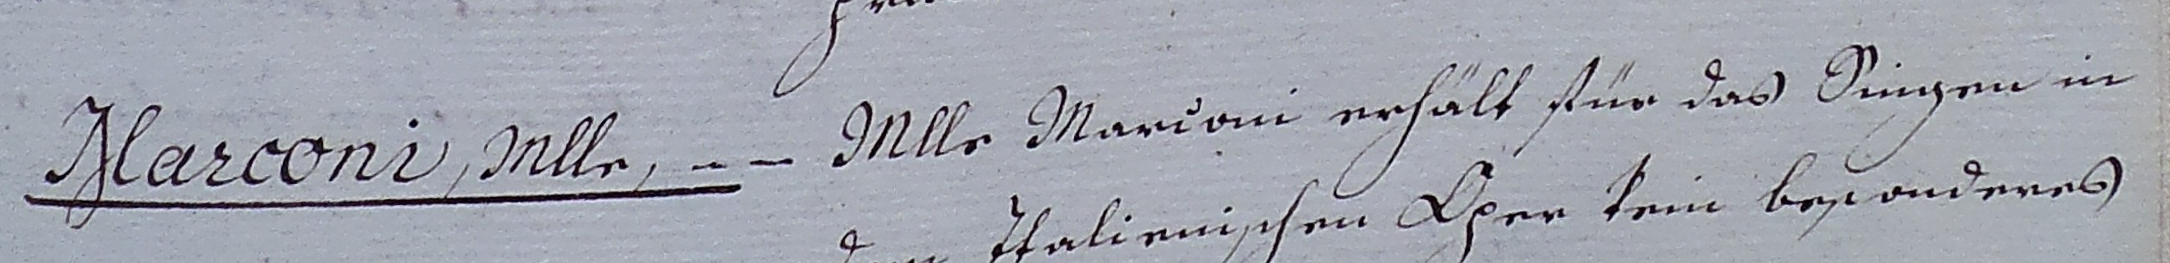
Marconi, Mlle, .. .. Mlle Marconi erhält für das Singen in
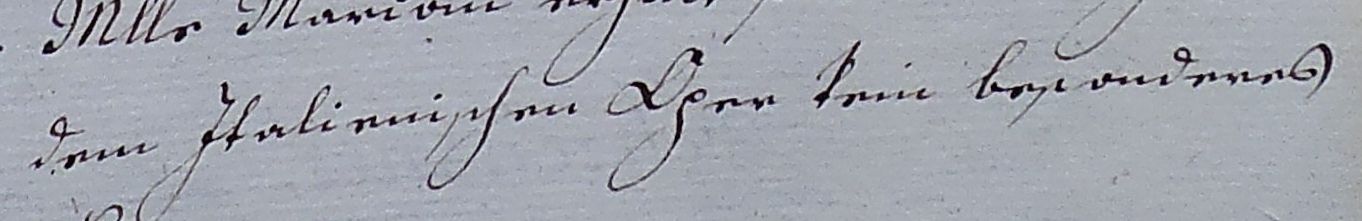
der Italienischen Oper kein besonderes
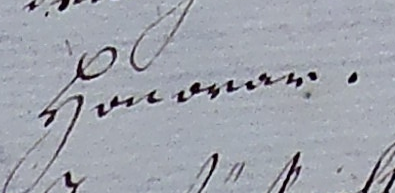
Honorar.
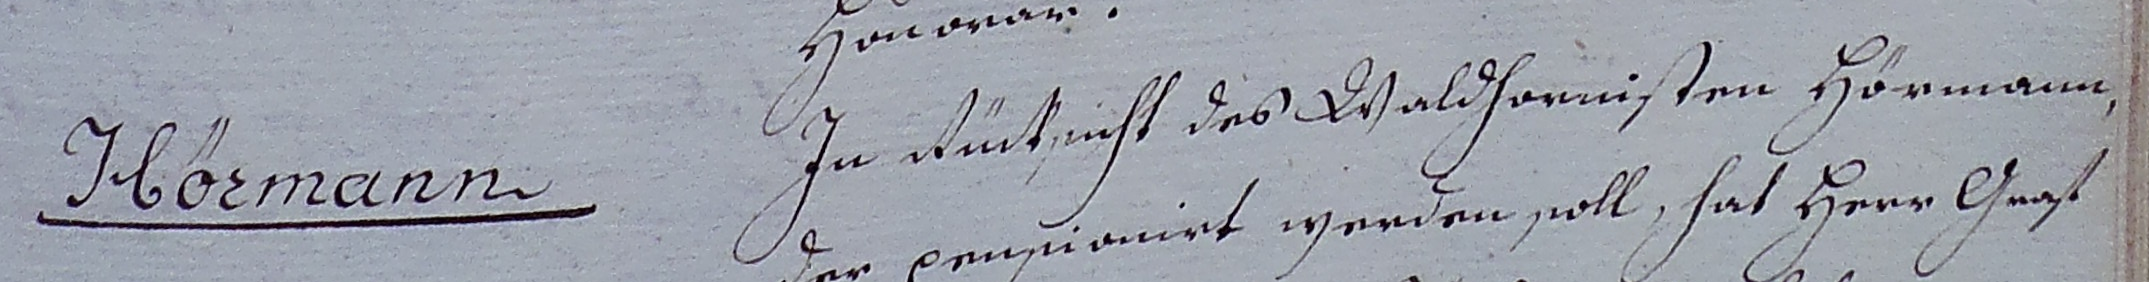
Hörmann In Rücksicht des Waldhornisten Hörmann,
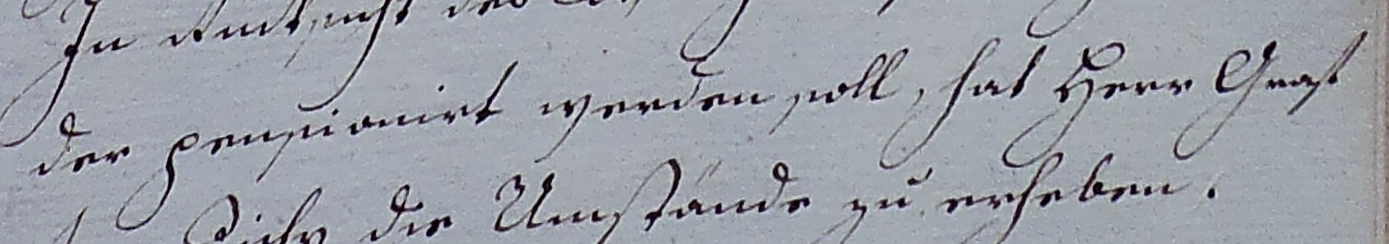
der pensionirt werden soll, hat Herr Graf
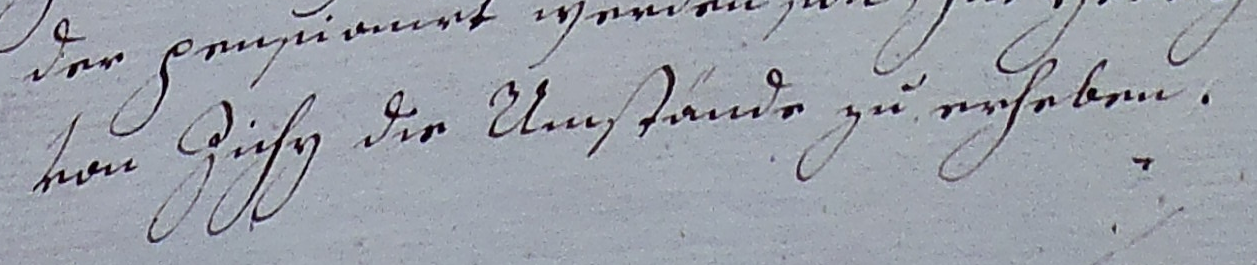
von Zichy die Umstände zu erheben.
